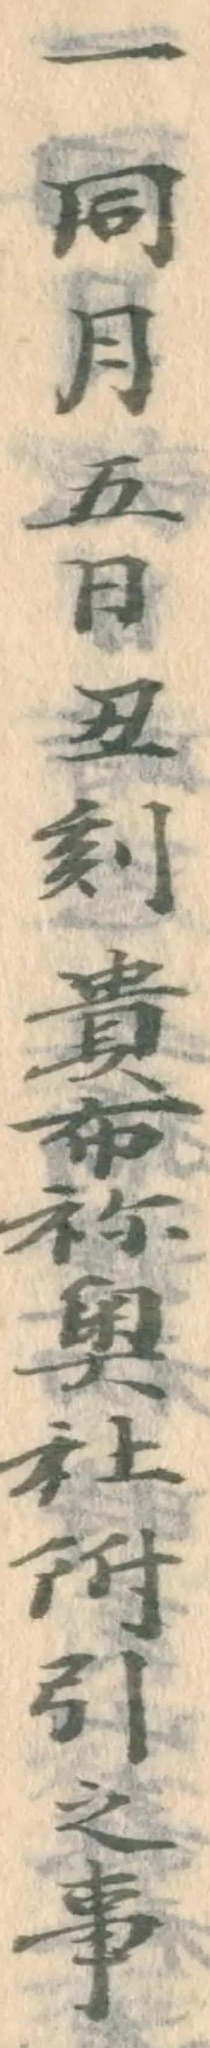一同月五日丑刻貴布祢奥社附引之事
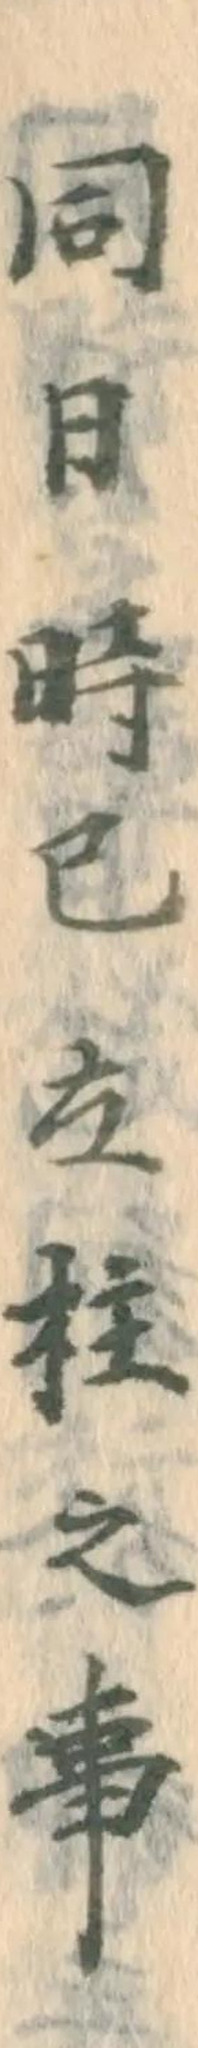同日時巳立柱之事

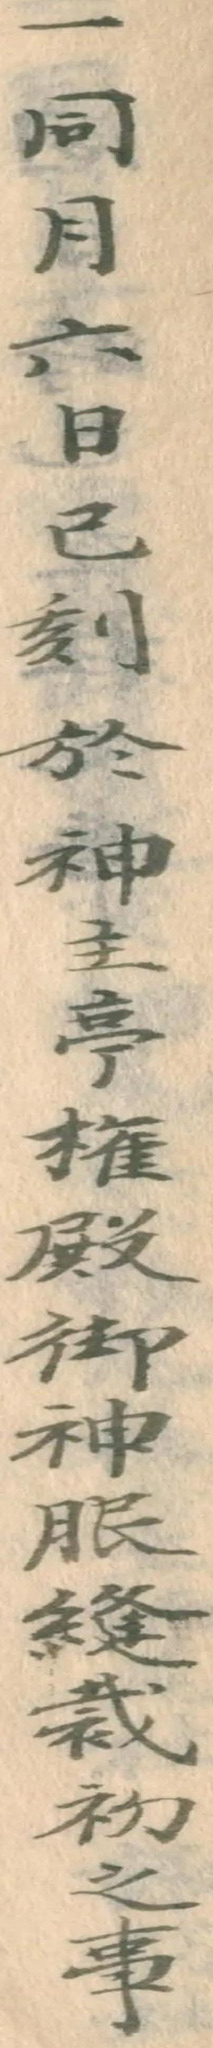一同月六日巳刻於神主亭権殿御神服縫裁初之事
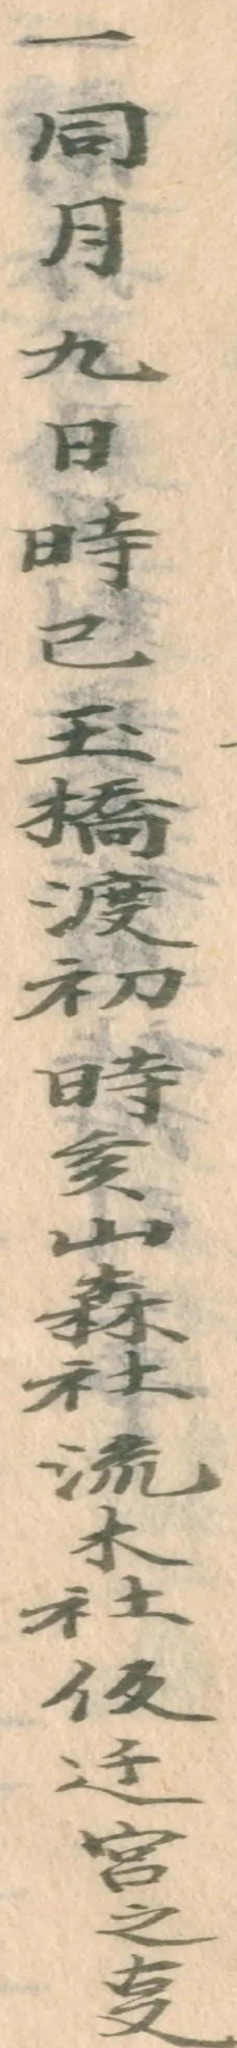一同月九日時巳玉橋渡初時亥山森社流木社仮迁宮之事
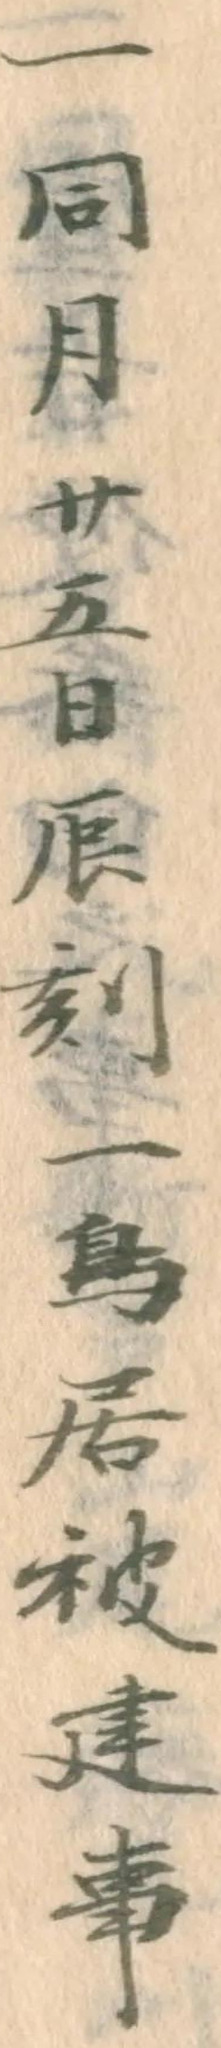一同月廿五日辰刻一鳥居被建事
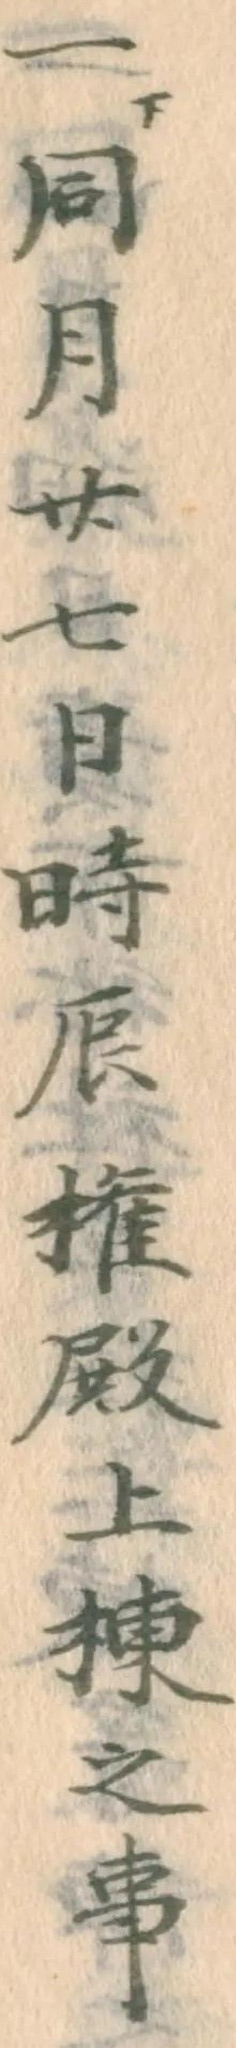一同月廿七日時辰権殿上棟之事
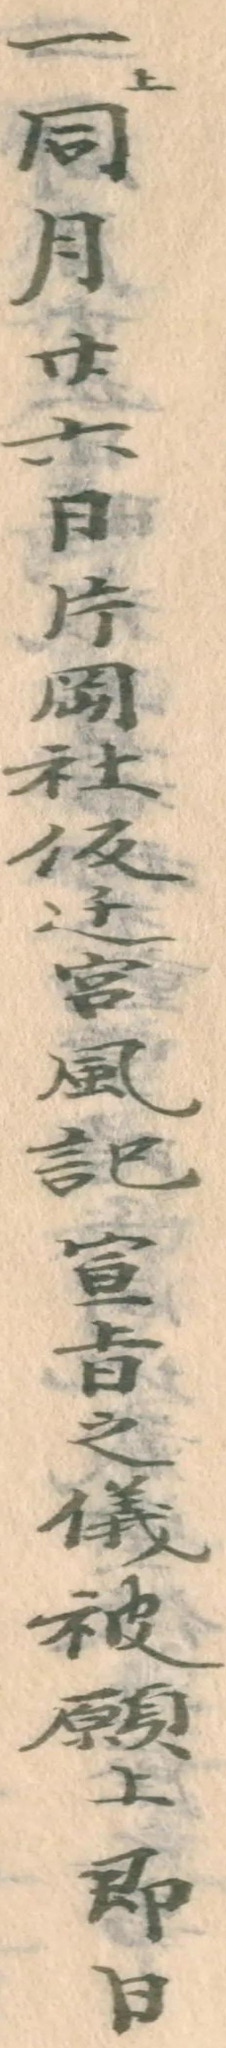一同月廿六日片岡社仮迁宮風記宣旨之儀被願上即日
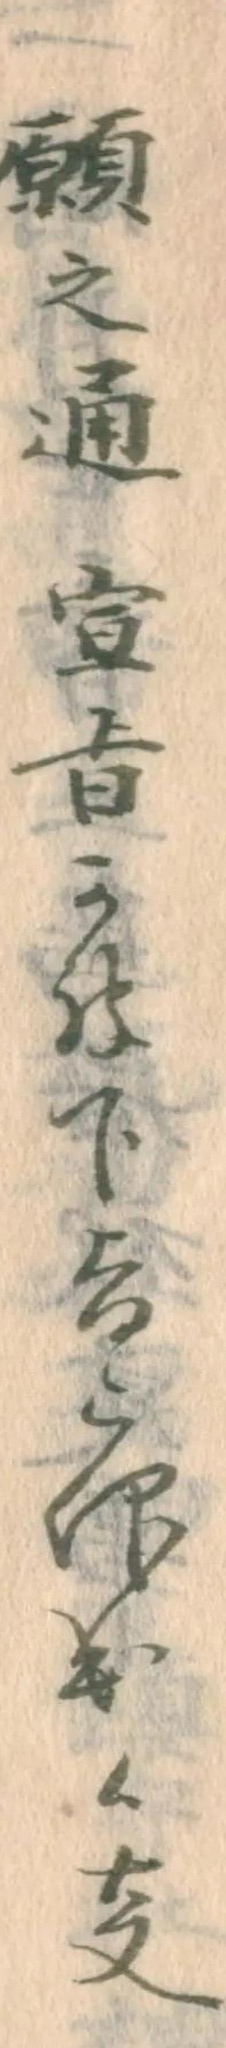願之通宣旨可被下旨被仰出候事
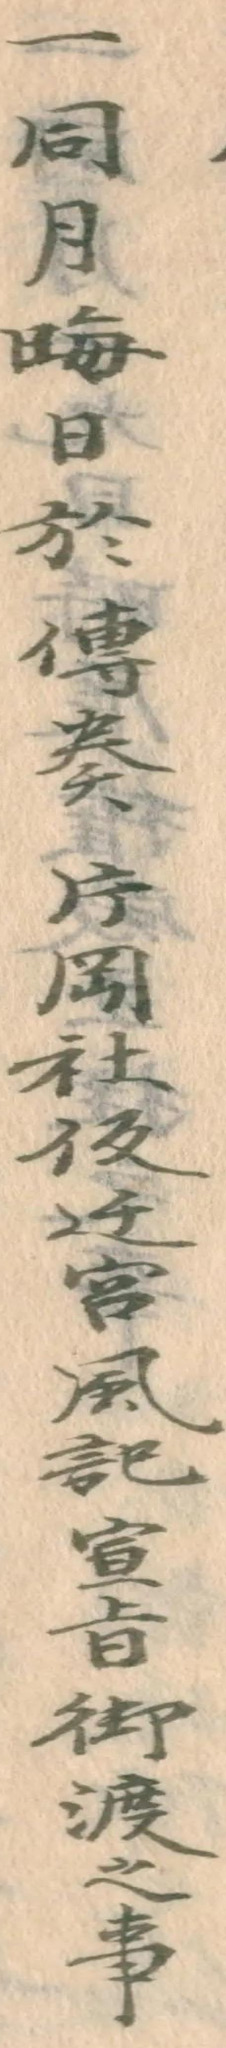一同月晦日於伝奏片岡社仮迁宮風記宣旨御渡之事
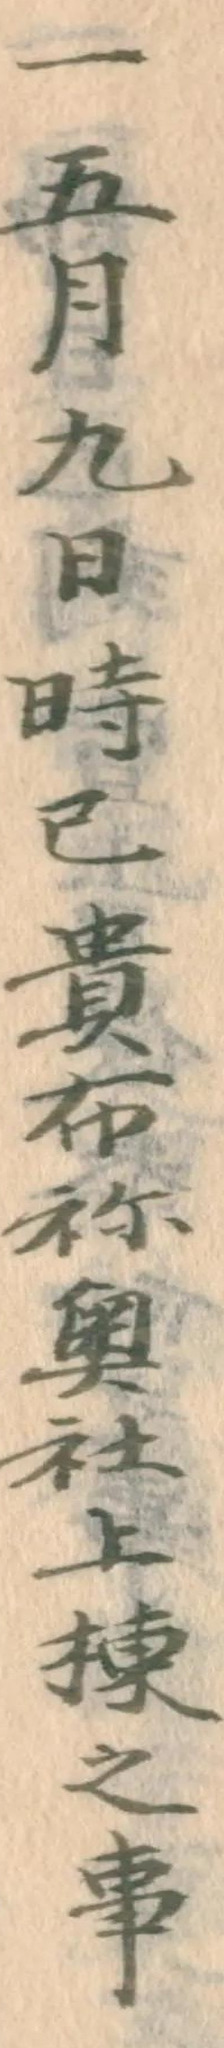一五月九日時巳貴布祢奥社上棟之事
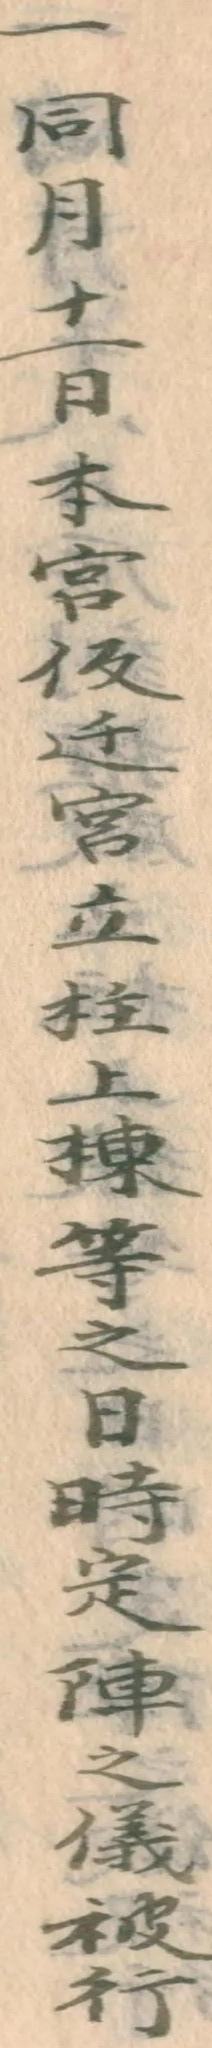一同月十一日本宮仮迁宮立柱上棟等之日時定陣之儀被行
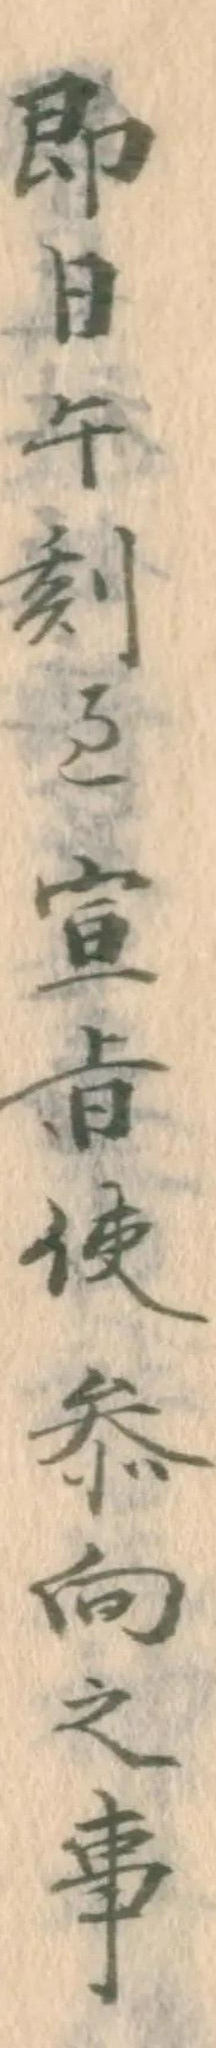即日午刻過宜旨使参向之事
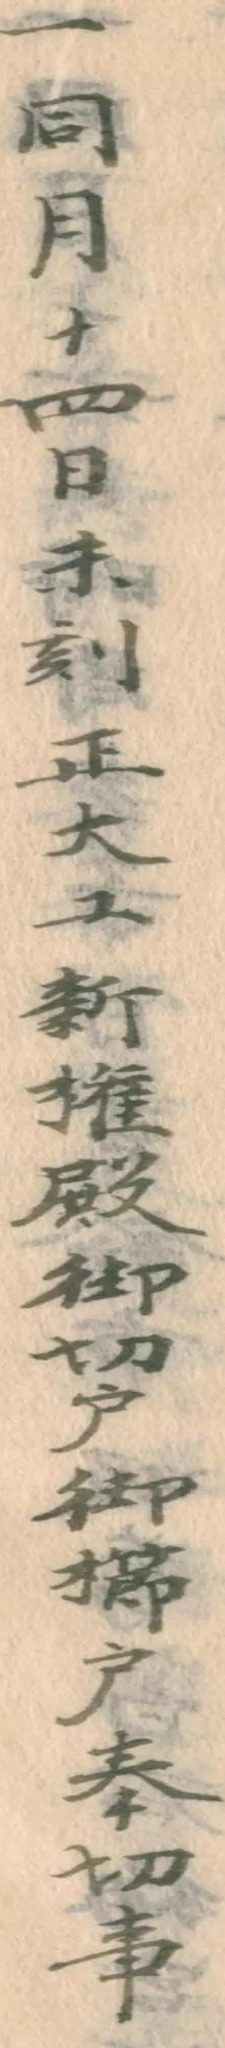一同月十四日未刻正大工新権殿御切戸御櫛戸奉切事
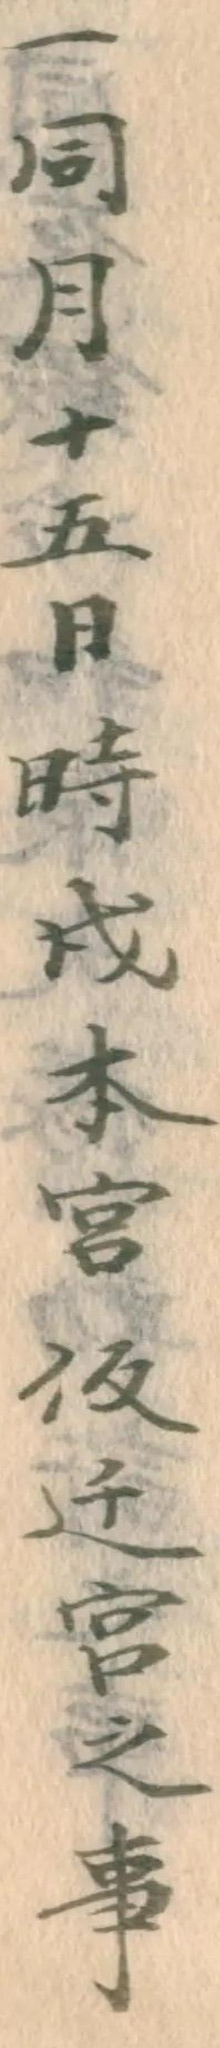一同月十五日時戌本宮仮迁宮之事
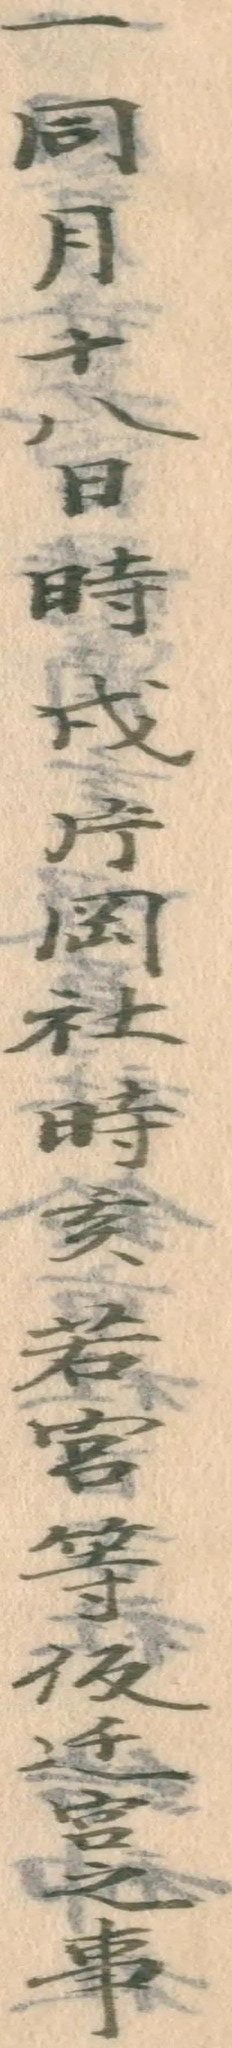一同月十八日時戌片岡社時亥若宮等仮迁宮之事
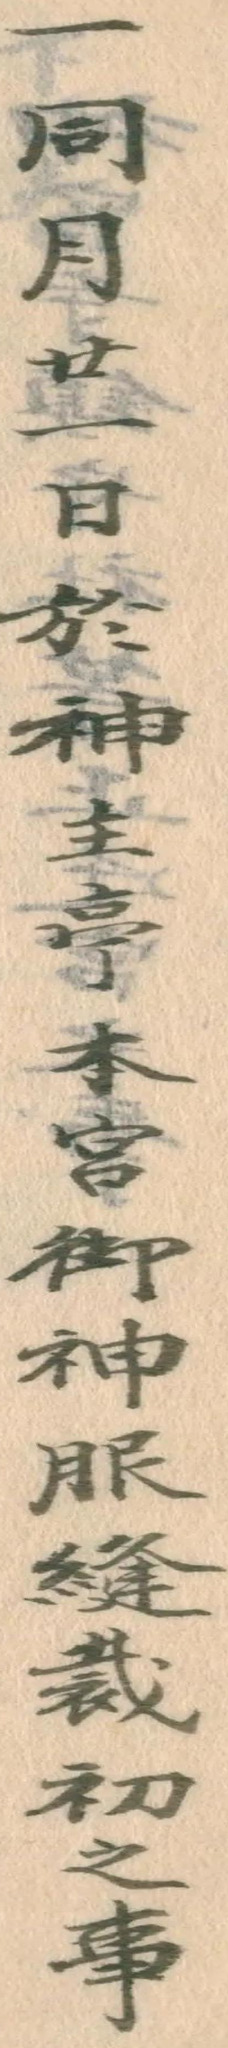一同月廿一日於神主亭本宮御神服縫裁初之事
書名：賀茂社記録. 第17冊
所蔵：国立国会図書館 National Diet Library, JAPAN
